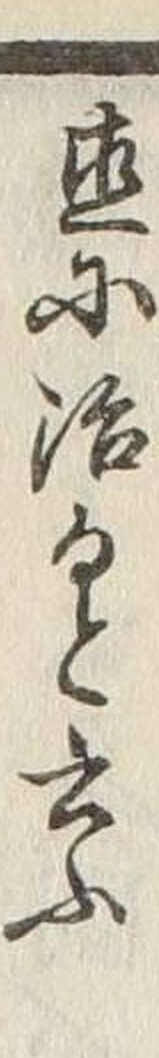直に治ると云ふ
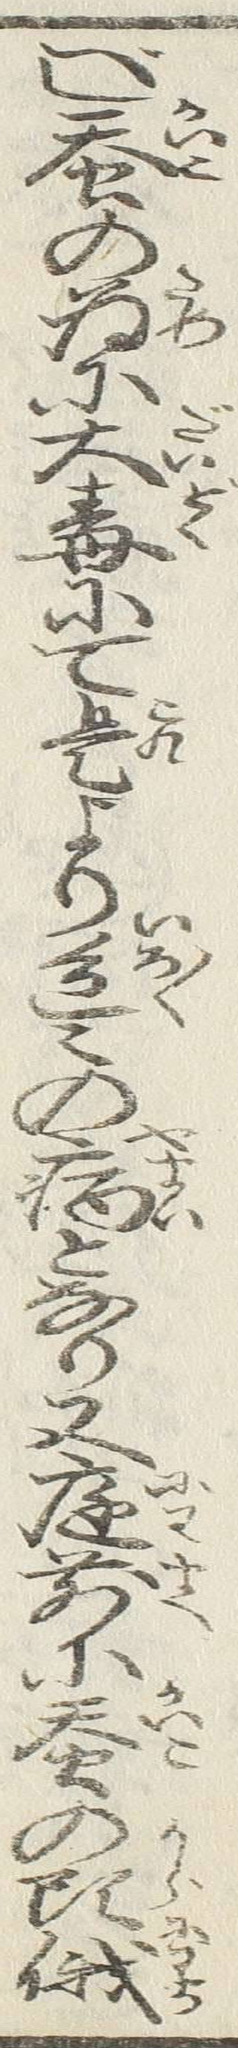べし蚕の為に大毒にて是より色々の病となり又庭前に蚕の頭俄
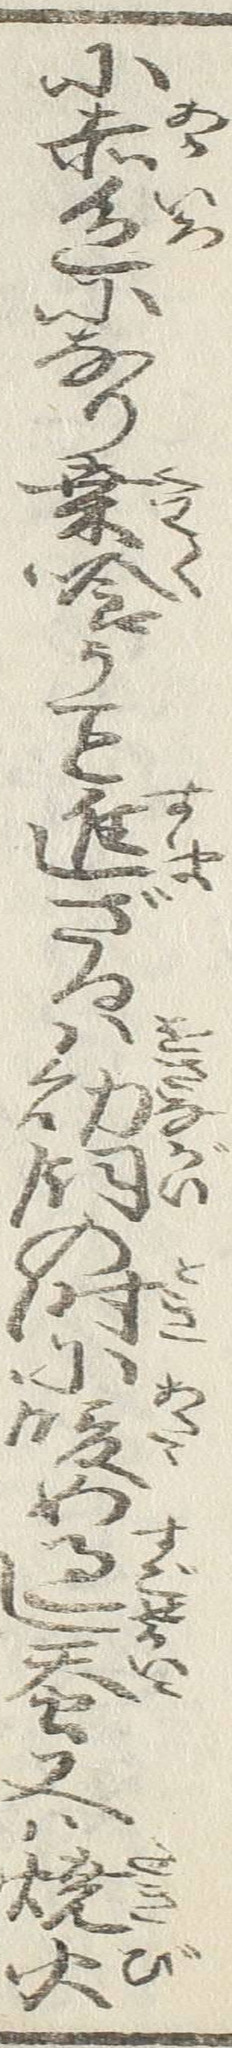に赤色になり桑喰うこと進ざるは幼飼の時に暖め過し蚕又は焼火
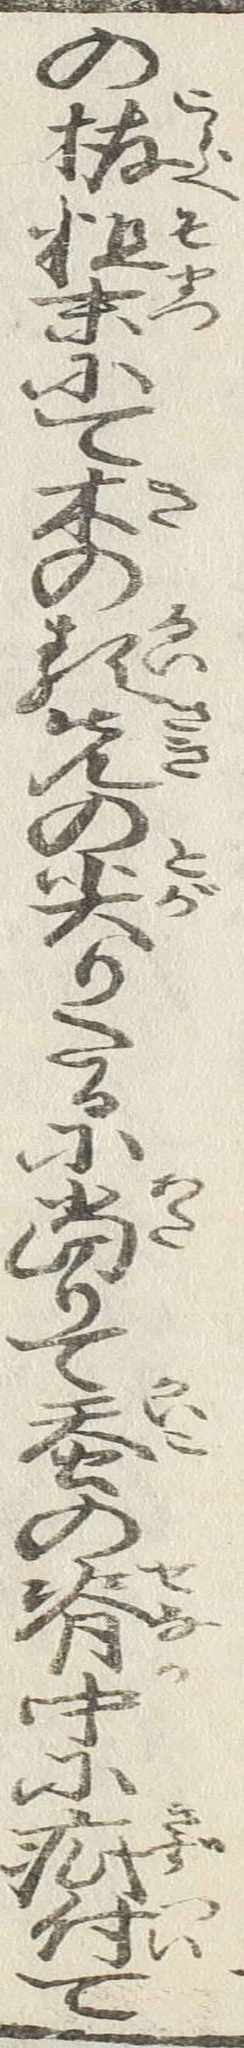の拵粗末にて木の類先の尖りたるに当りて蚕の脊中に疵付て
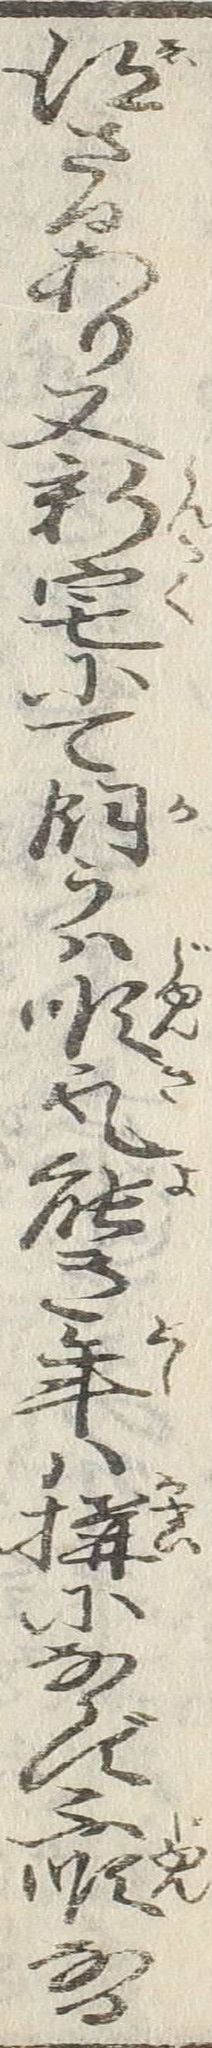得さるあり又新宅にて飼うは順気能き年は搆にならずふ順なる
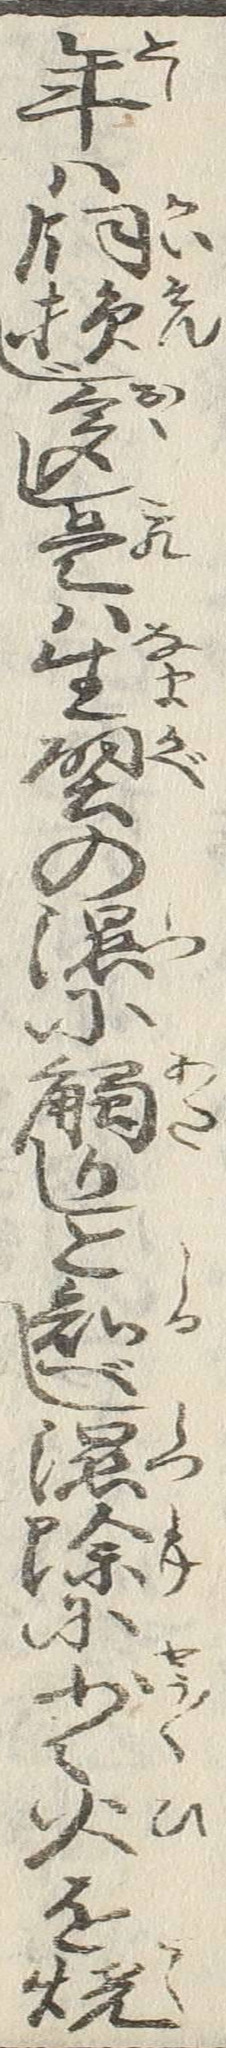年は飼損じ多し是は生壁の湿に觸りしと知べし湿除に少々火を焼
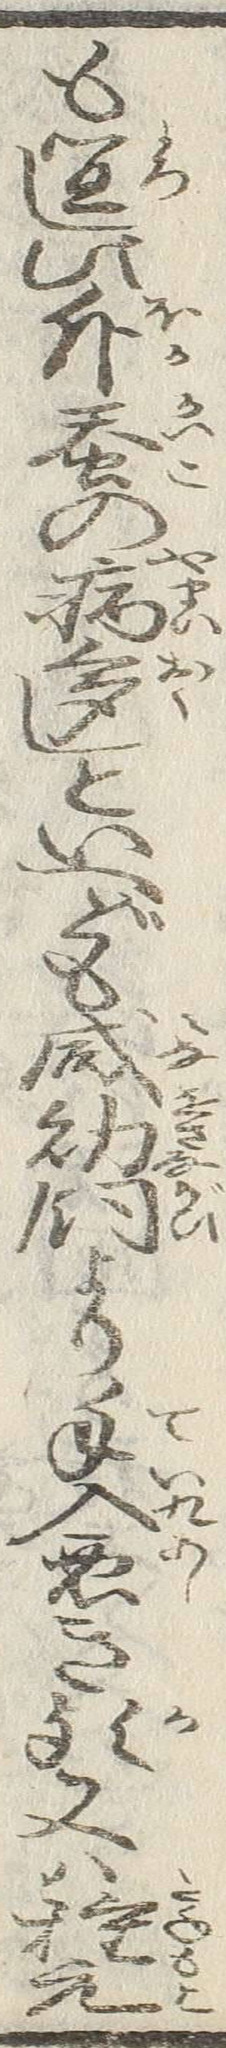も宜し此外蚕の病多しといへども咸幼飼より手入悪き歟又は種元
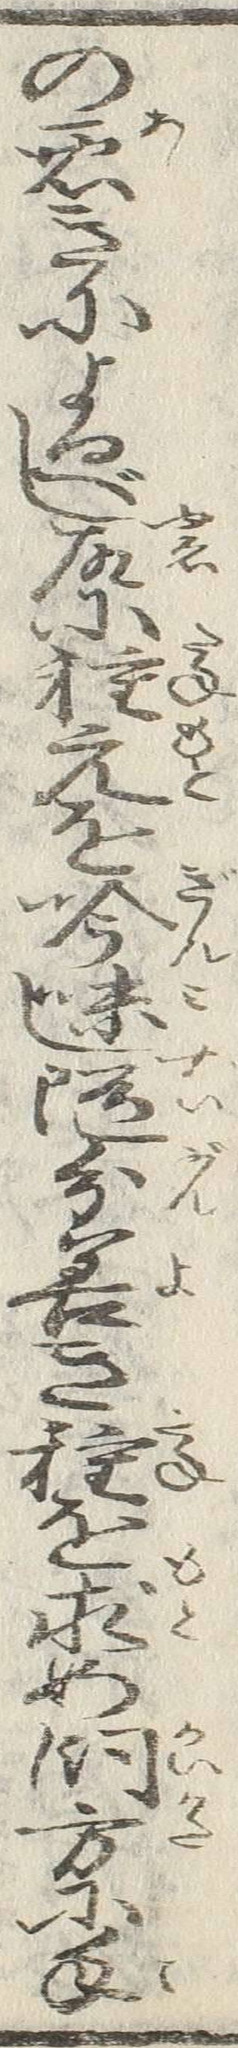の悪きによるべし故に種元を吟味し随分善き種を求め飼方に手
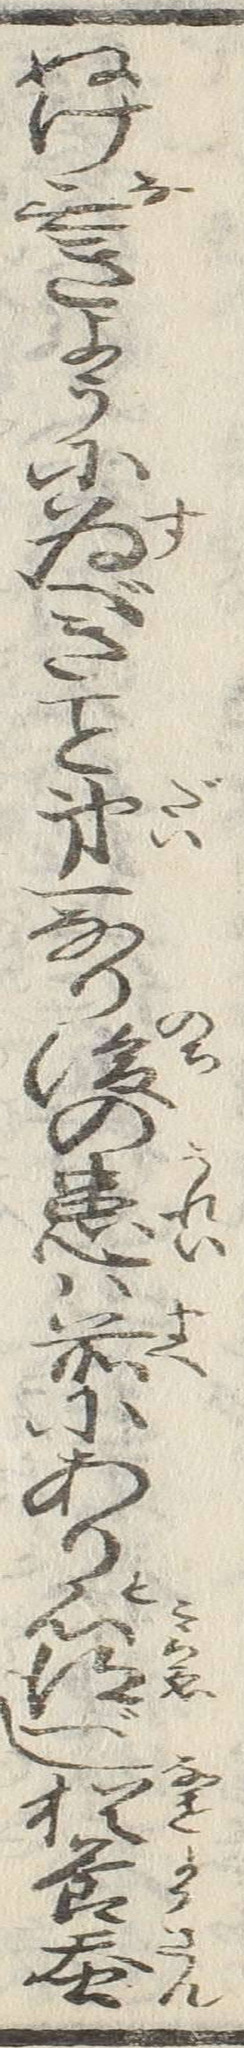ぬけ無きように為べきこと第一なり後の患は前にありと心得べし猶養蚕
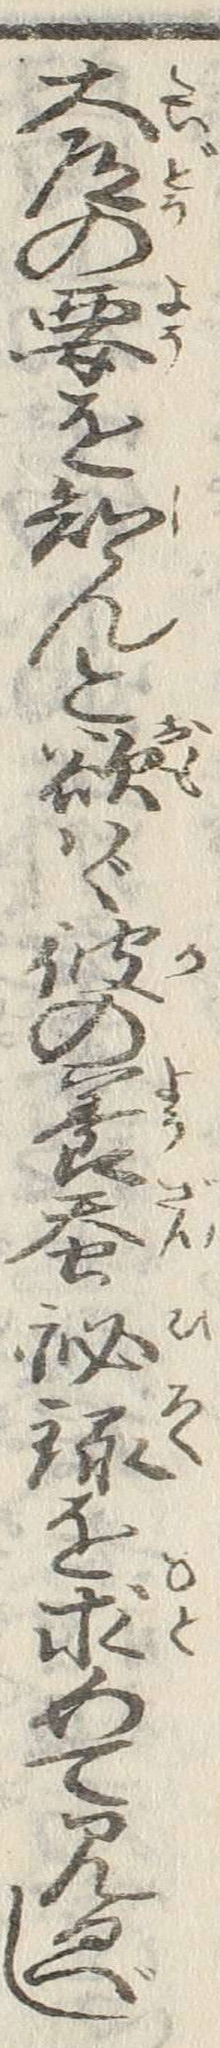大道の要を知らんと欲はゞ彼の養蚕秘録を求めて見るべし
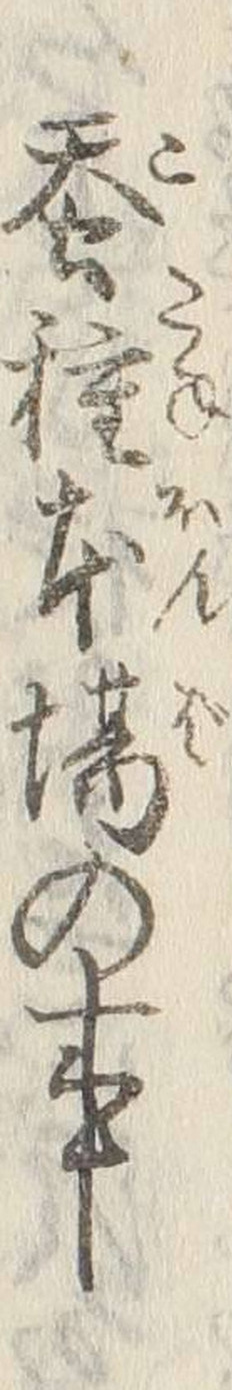蚕種本場の事
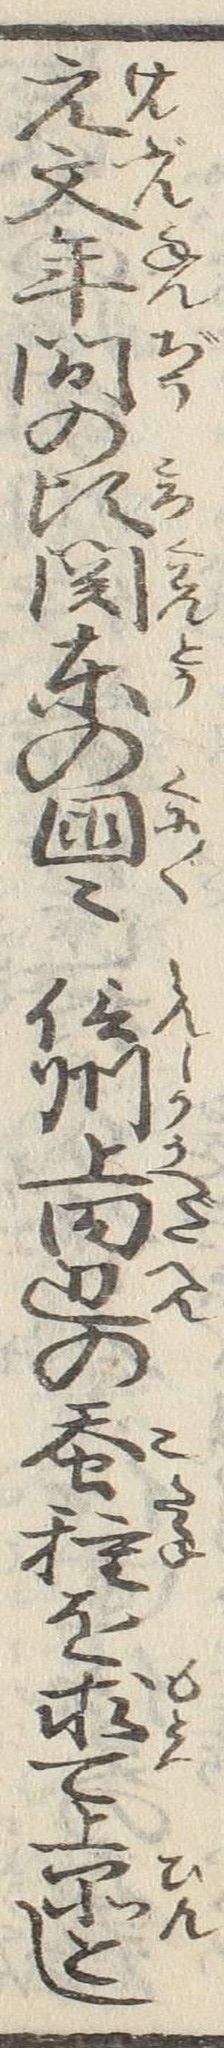元文年間の頃関東の國々信州上田辺の蚕種を求て上品とし
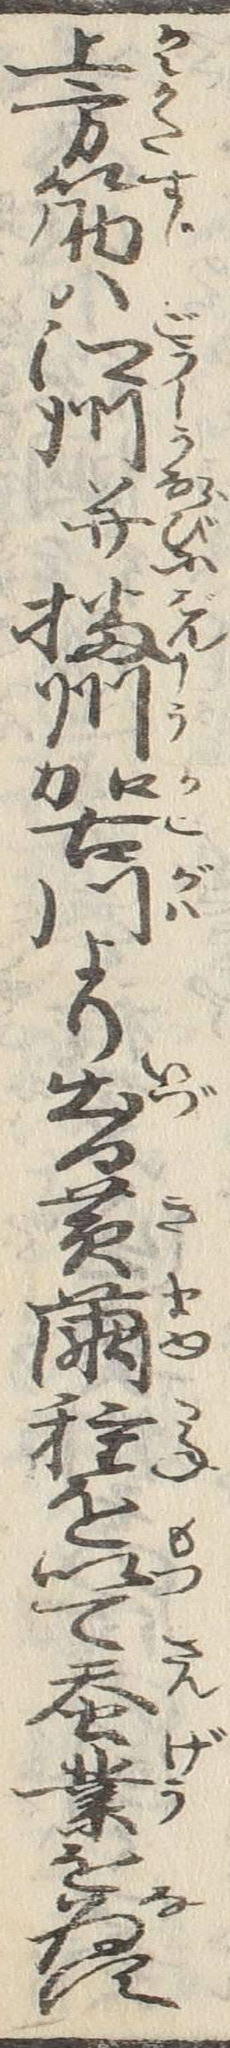上方筋は江州幷播州加古川より出る黄繭種を以て蚕業を為す

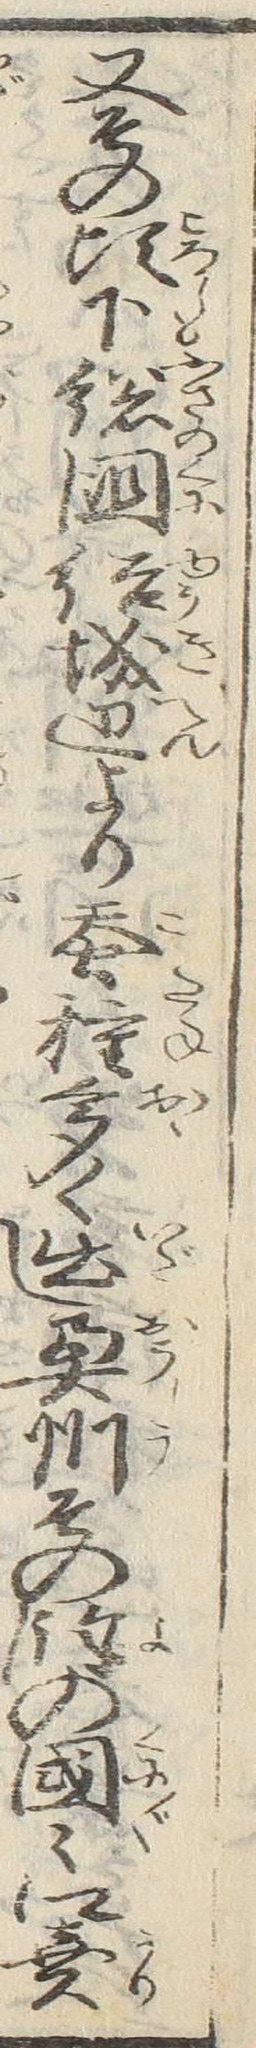又その頃下総國結城辺より蚕種多く出し奥州その餘の國々え賣
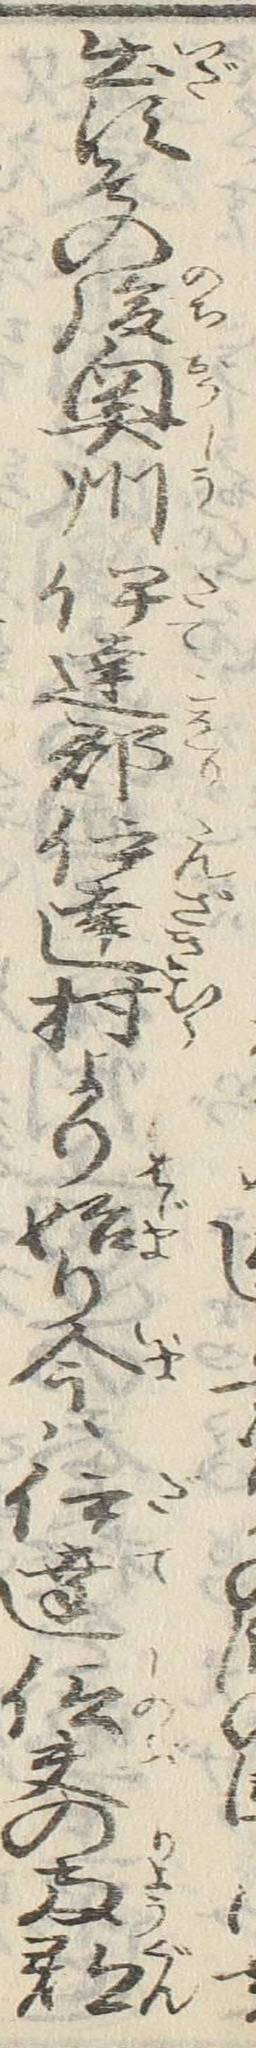出すその後奥州伊達郡伊達村より始り今は伊達信夫の両郡
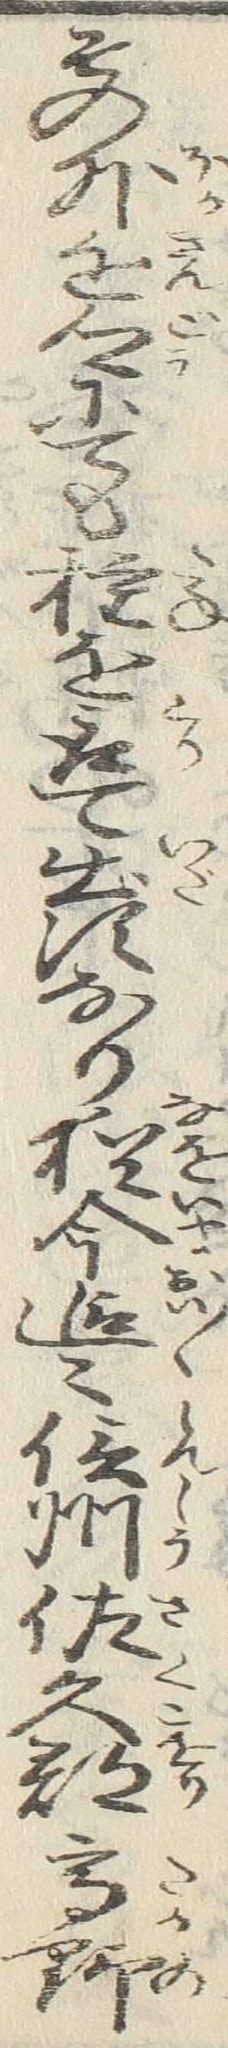その外近郷にても種を取て出すなり猶今追々信州佐久郡高野
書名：養蠶實驗録
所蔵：東京大学農学生命科学図書館 国文学研究資料館
